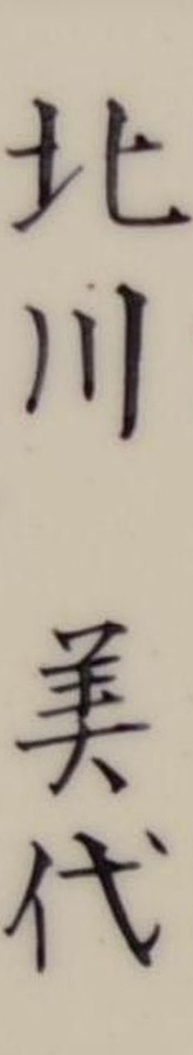北川美代
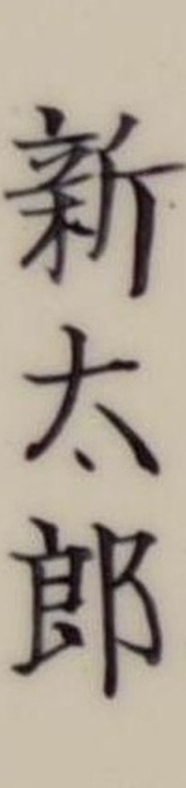新太郎
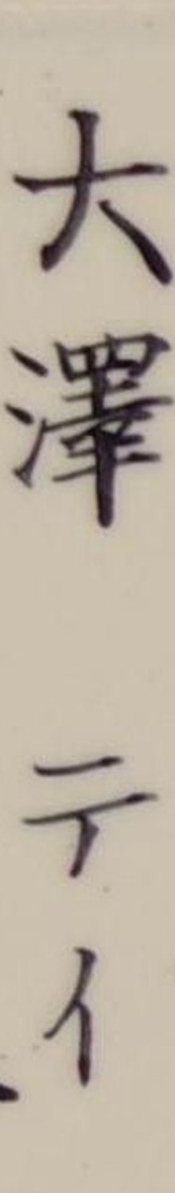大澤テイ
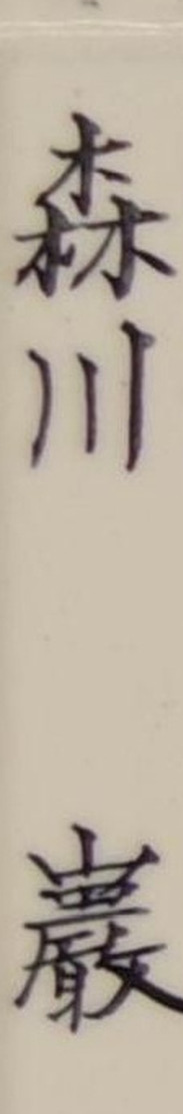森川巌

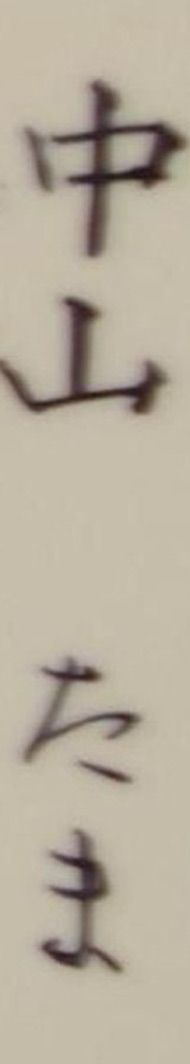中山たま
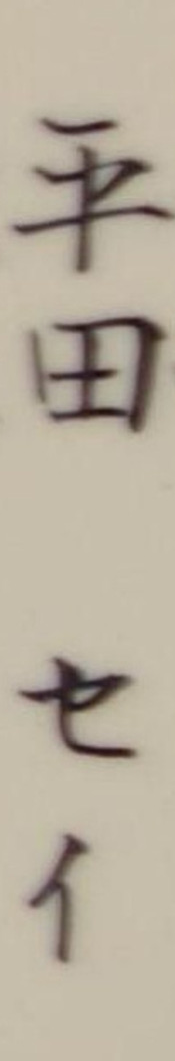平田セイ
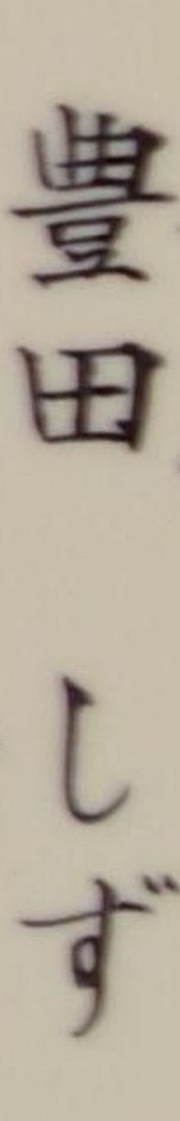豊田しず
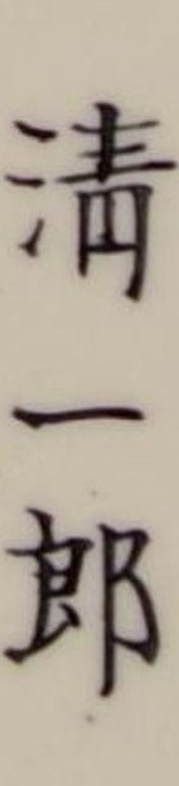清一郎
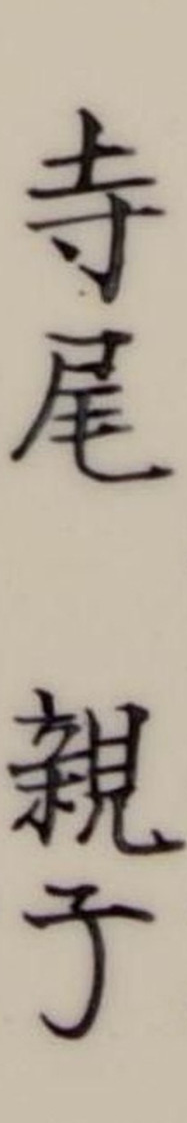寺尾親子
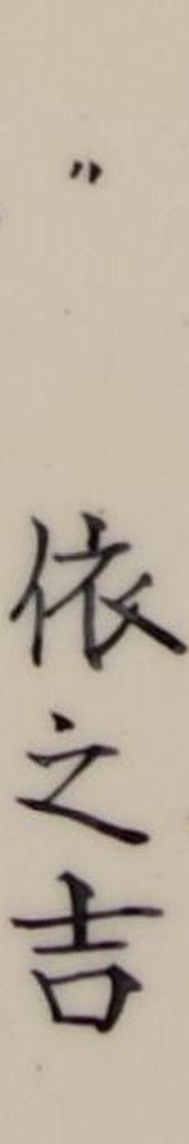依之吉
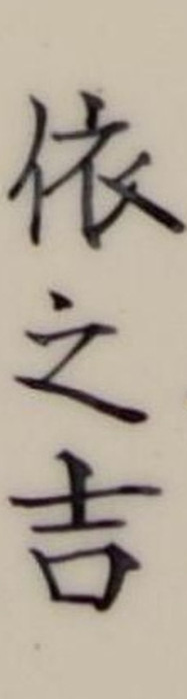依之吉
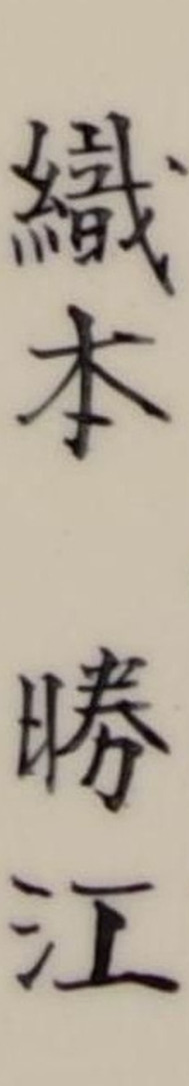織本勝江
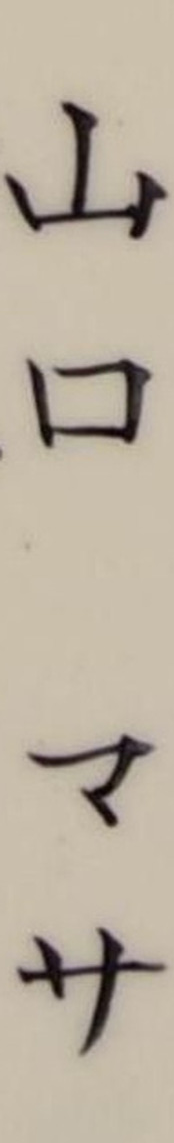山口マサ
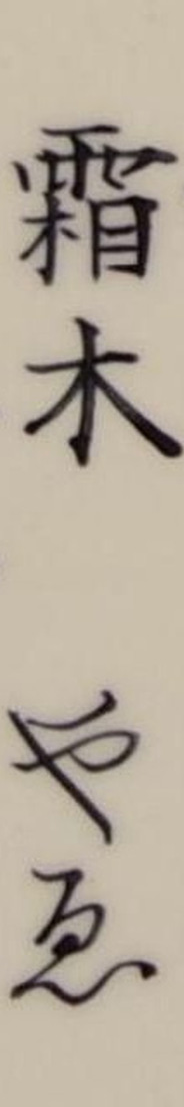霜木やゑ
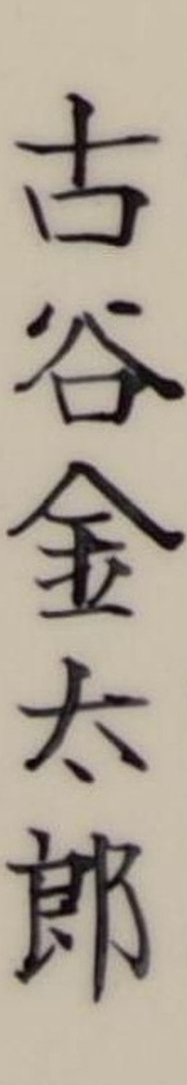古谷金太郎
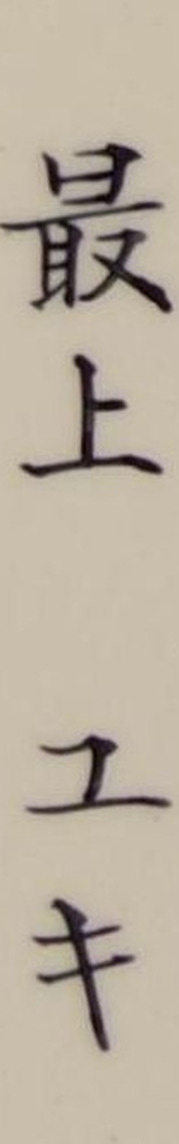最上ユキ
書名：M~S
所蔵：高野山金剛峯寺
